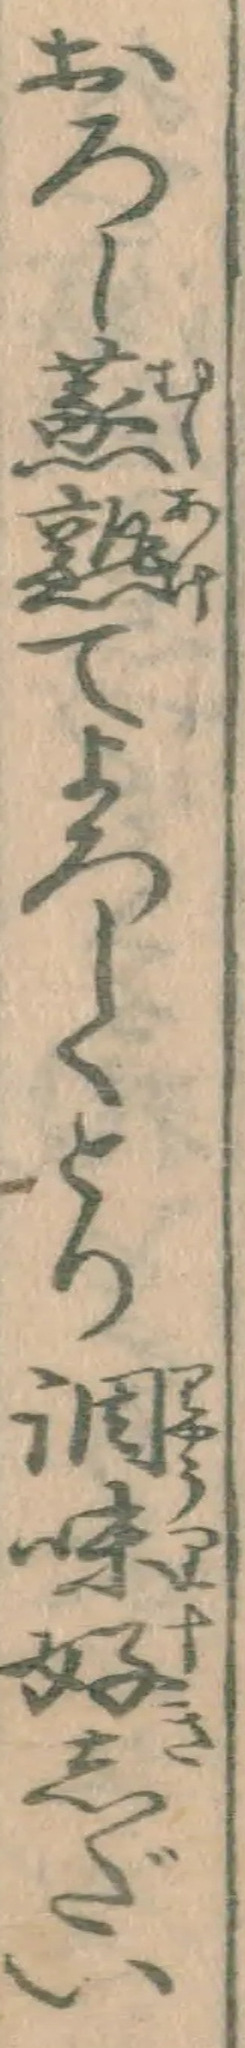おろし蒸熟てよろしくとり調味好しだい
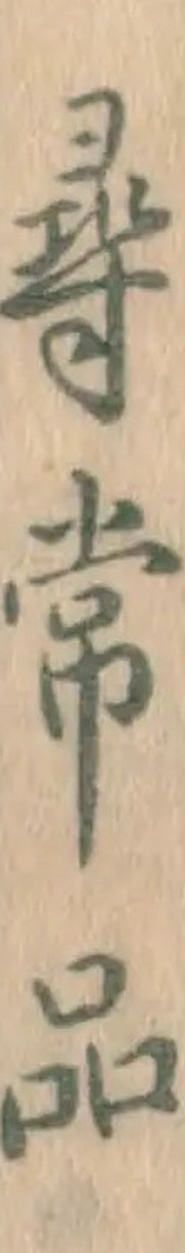尋常品
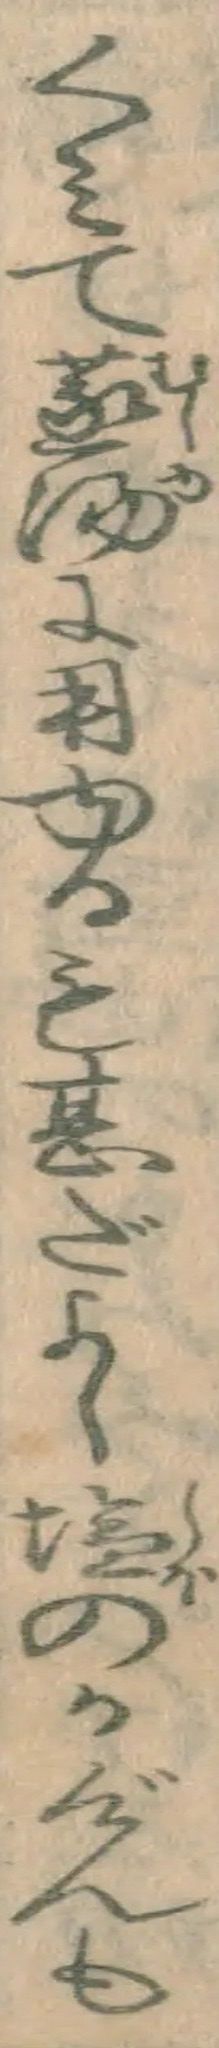くみて蒸湯に用ゆるも甚だよし塩のかげんも
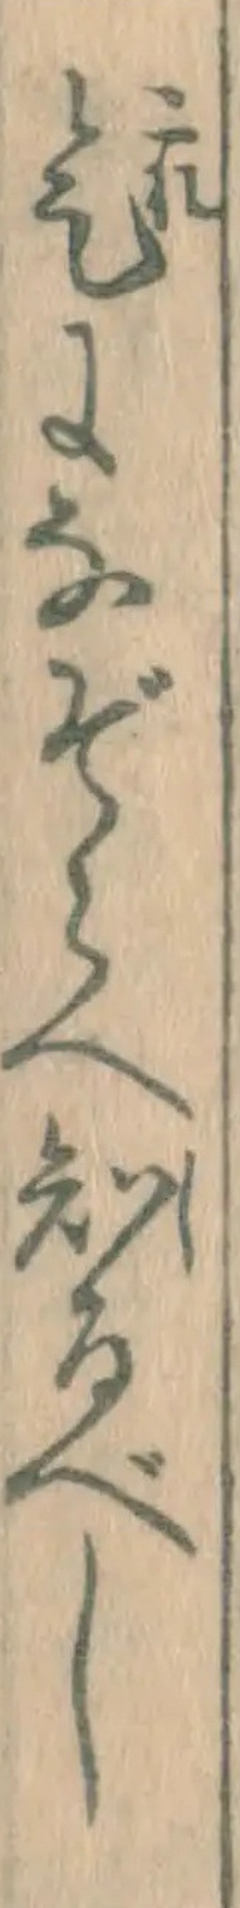是になぞらへ知るべし

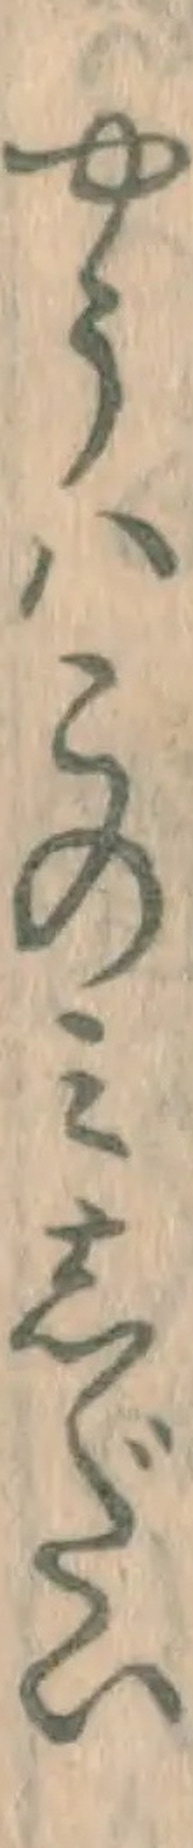やうはこのみしだい
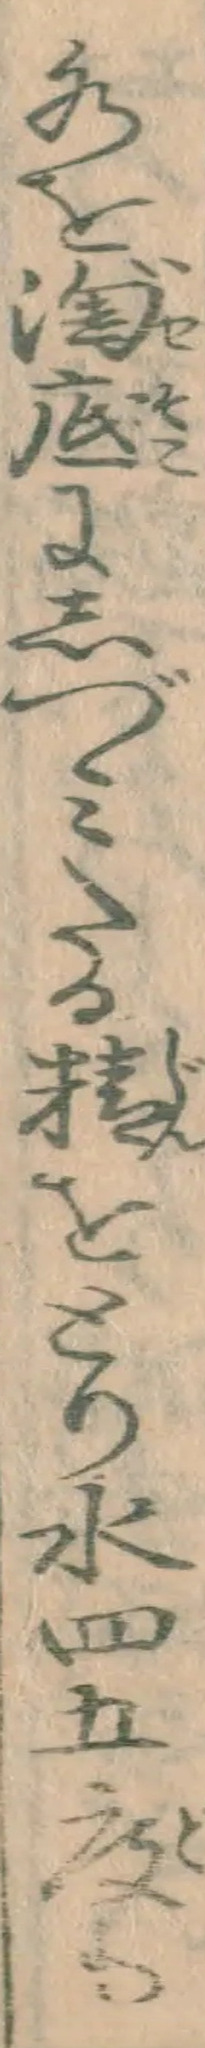水を淘底にしづみたる精をとり水四五度も
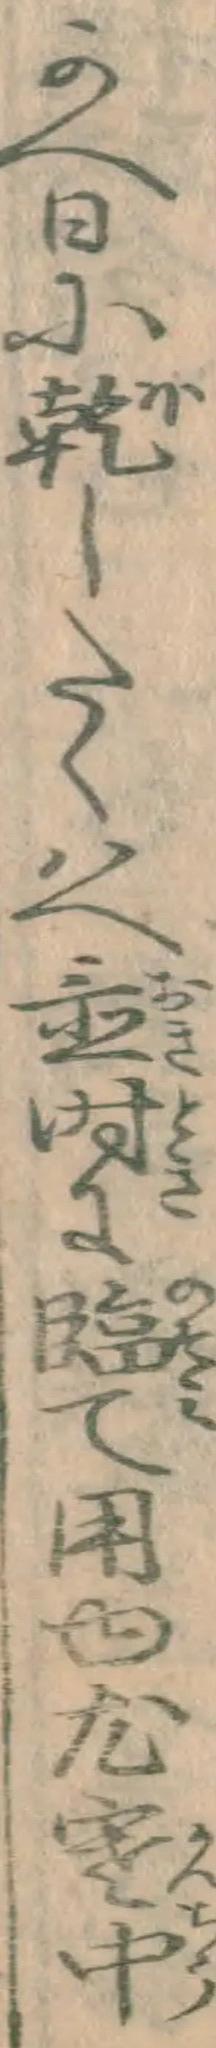かへ日に乾したくはへ置時に臨て用ゆ尤寒中
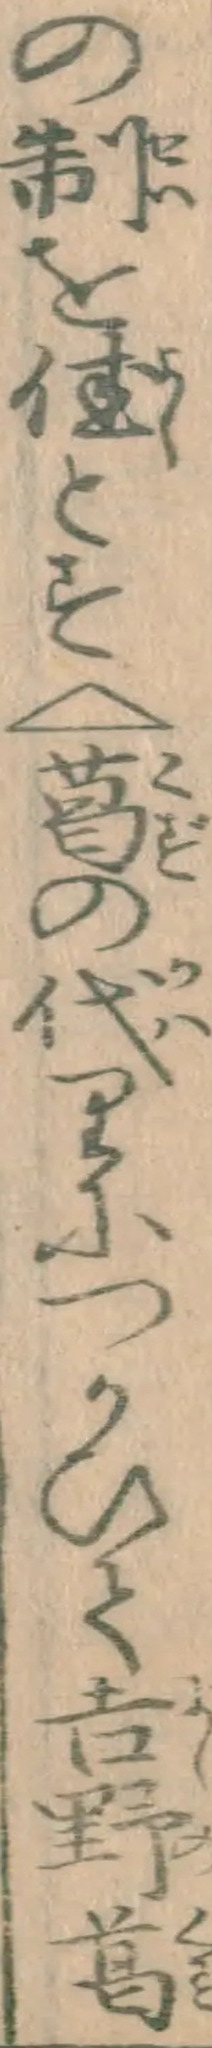の制を佳とす△葛の代りにつかひて吉野葛
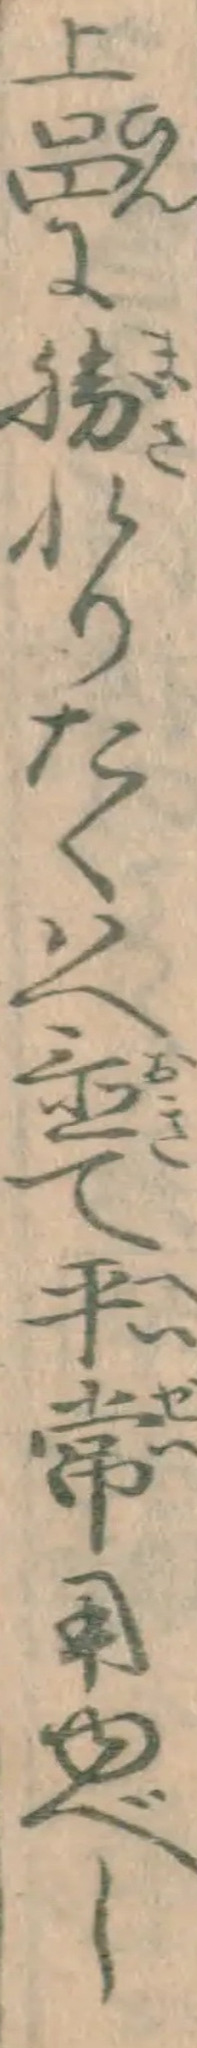上品に勝れりたくはへ置て平常用ゆべし
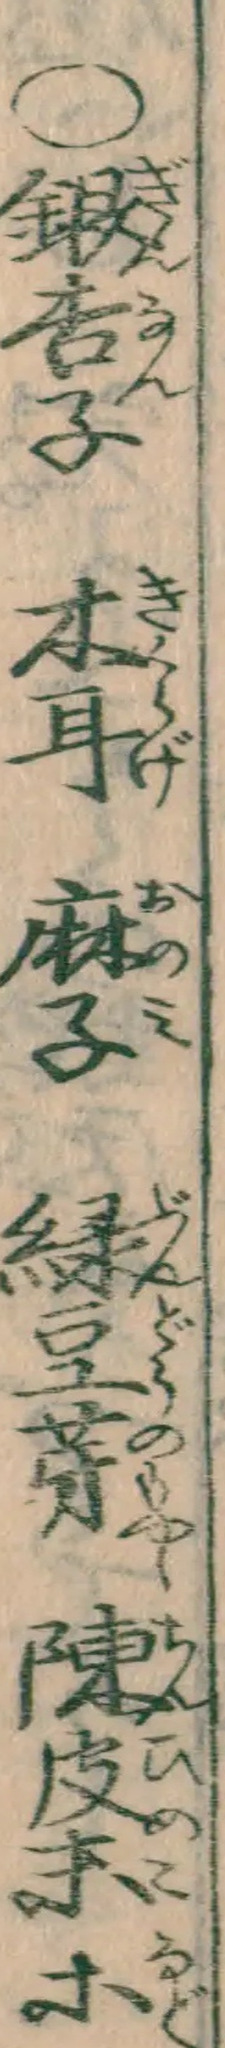◯銀杏子木耳麻子緑豆芽陳皮末等
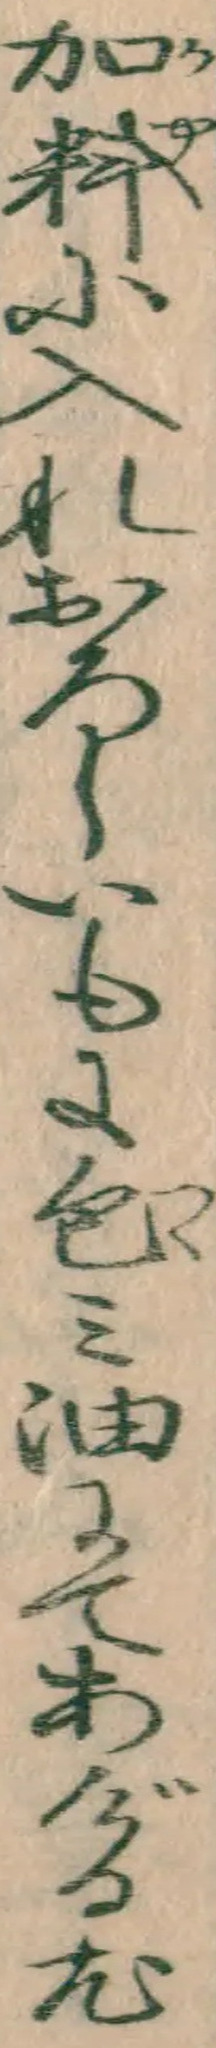加料に入れおろしいもに包み油にてあげる尤
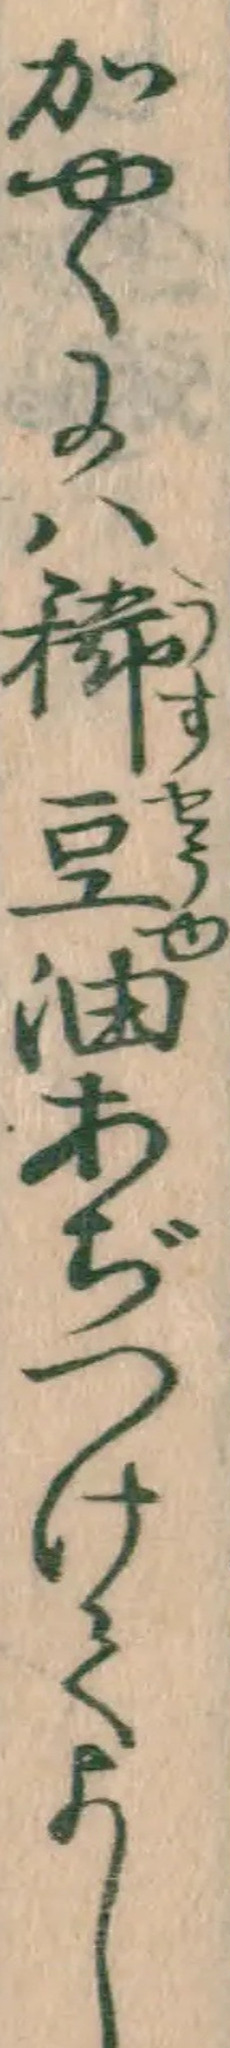かやくには稀豆油あぢつけてよし
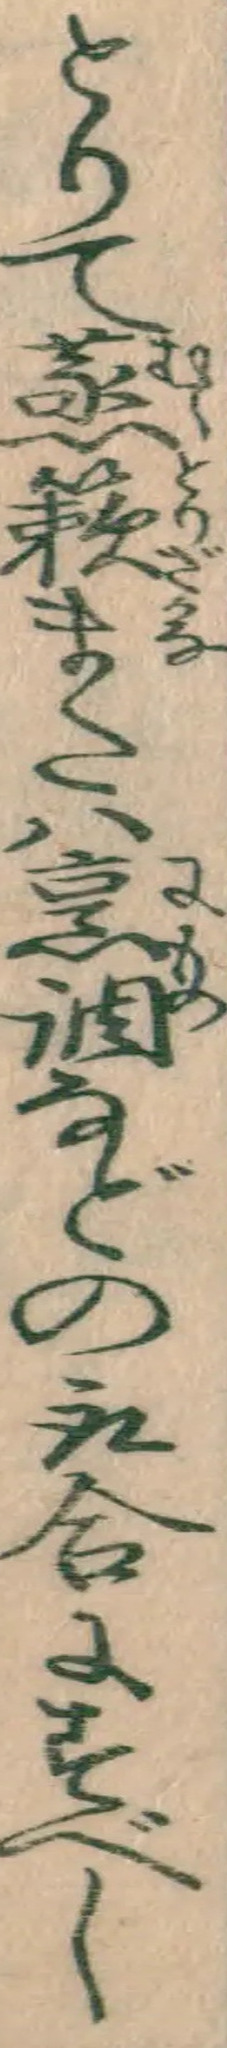とりて蒸簌または烹調などの取合にすべし
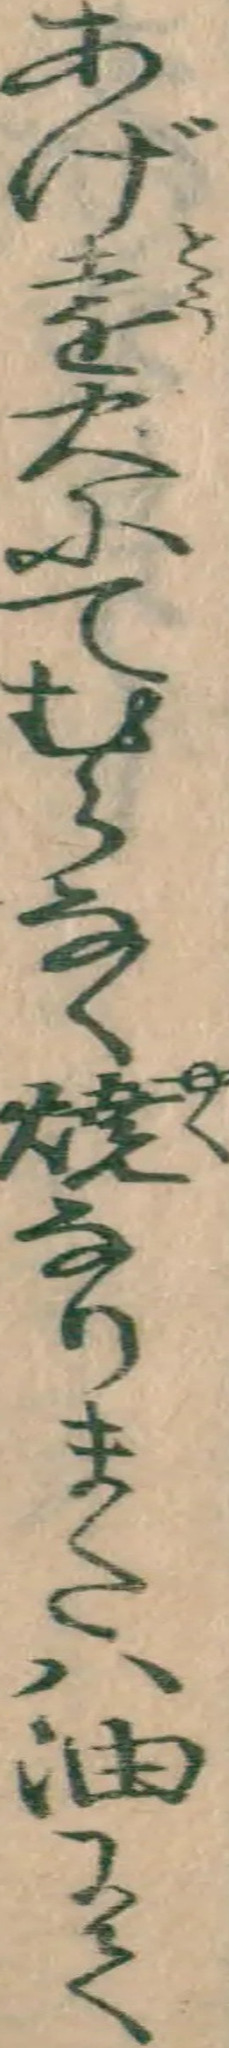あげ遠火にてむらなく焼なりまたは油にて

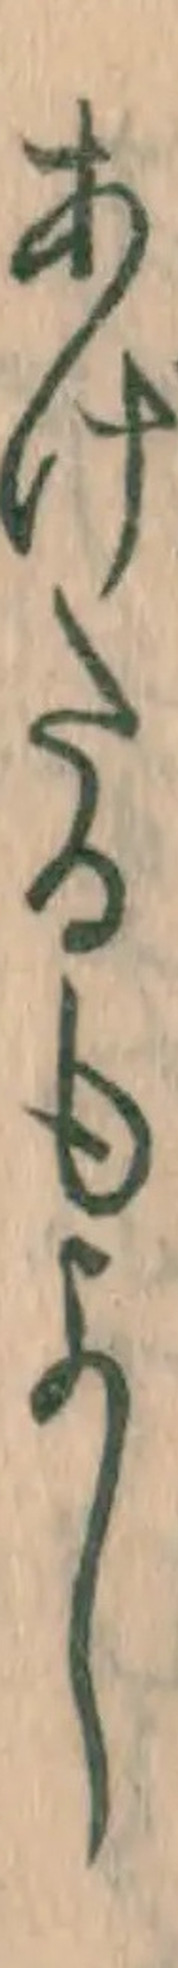あげたるもよし
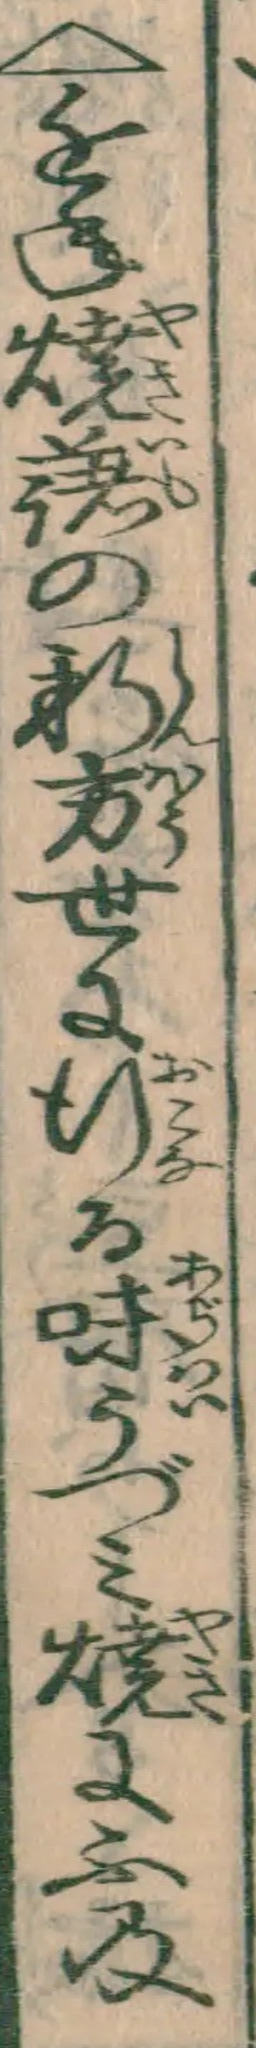△近年焼藷の新方世に行る味うづみ焼に不及
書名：甘藷百珍
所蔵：国立国会図書館 National Diet Library, JAPAN
